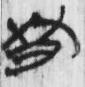冬（冬）
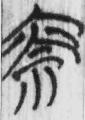○（夕）
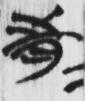之月
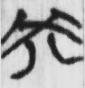癸
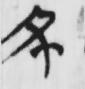丑
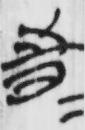之日
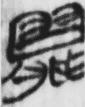○（一）
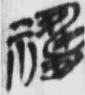禱
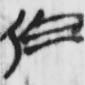於
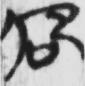卲
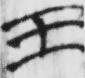王
